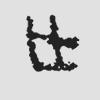甲
